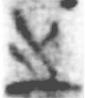之
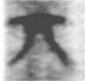亓（其）
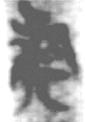○（旗）
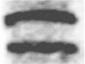二
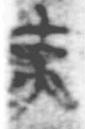黃
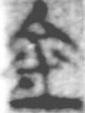金
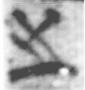之
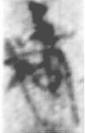○（伐）
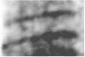二
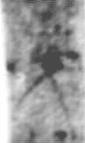戈
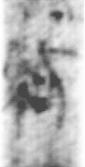紫
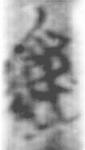○（紕）
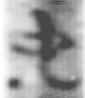屯
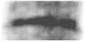一
